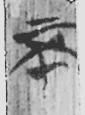不
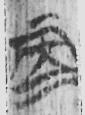再
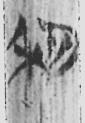利
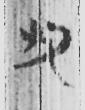屯
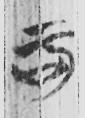可
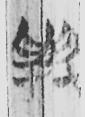與
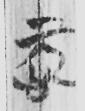{元心}
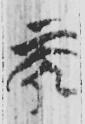而
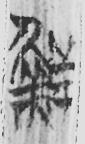鮮
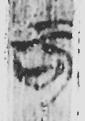可
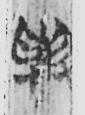與
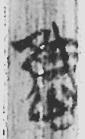惟
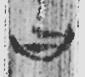曰
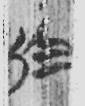於
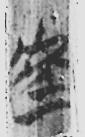𫊟（吾）
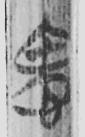畏
